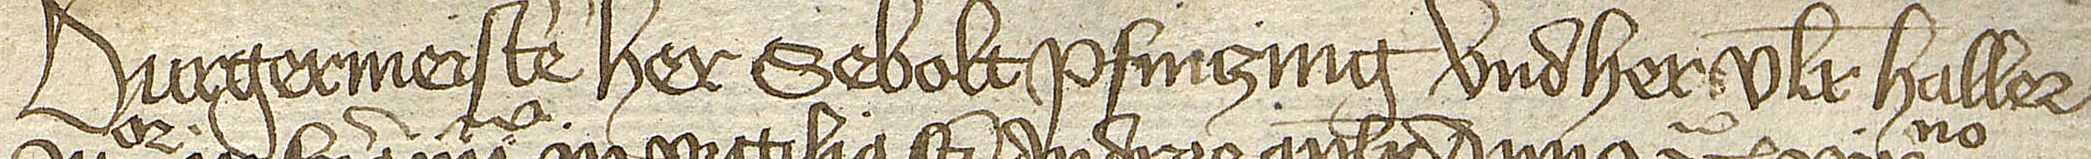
Burgermeiſte* Her Sebolt Pfincʒing Vnd Her Vlr* Haller
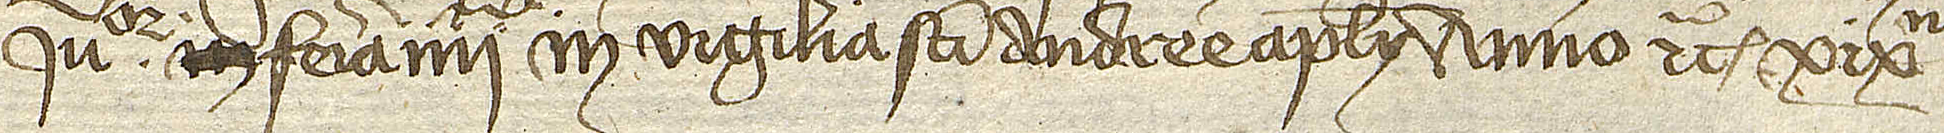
Iu* . in fei*a iiii* in vigilia ſci* Andree aply* Anni ec* xix*
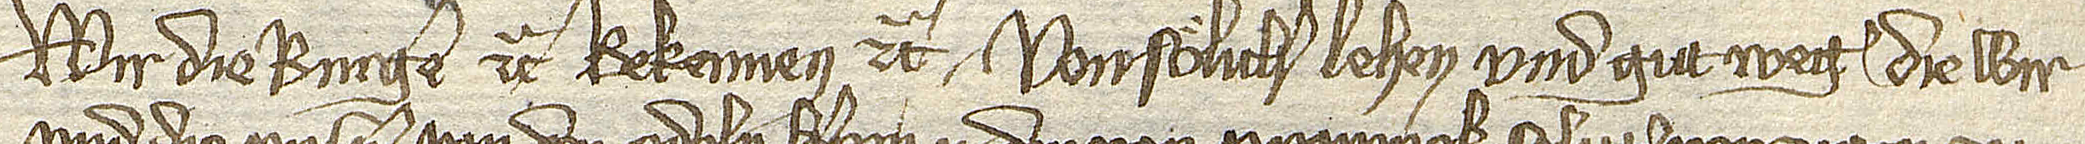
WIr die Burge* ec* Bekennen ec* / Von ſölich* lehen vnd gut weg* die wir
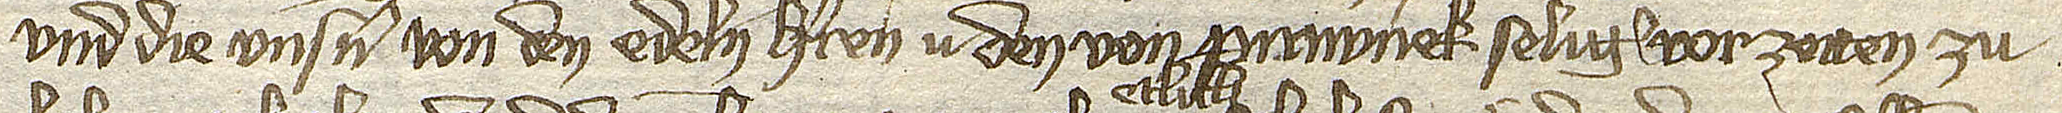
vnd die vnſn* von den edeln h*ren ~ den von Prawnek ſelig* vor ʒeiten ʒu
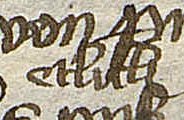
etlich
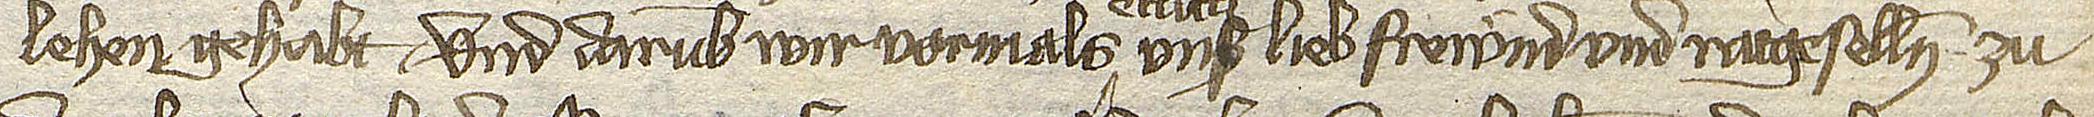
lehen gehabt / Vnd darub* wir vormals vnſ* lieb freẅnd vnd ratgeſelln* . ʒu
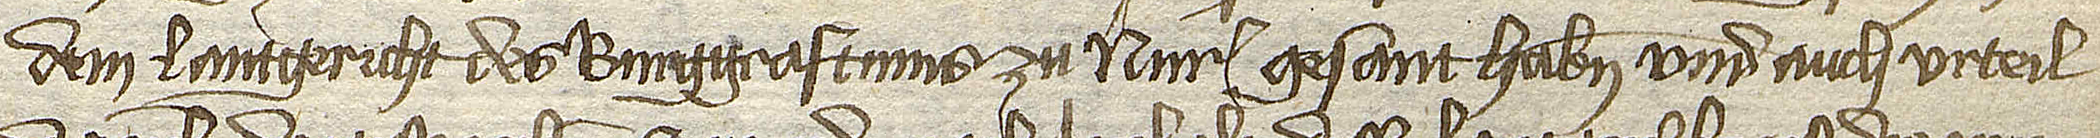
dem lantgericht des Burggraftums ʒu Nur* geſant habn* vnd auch vrteil
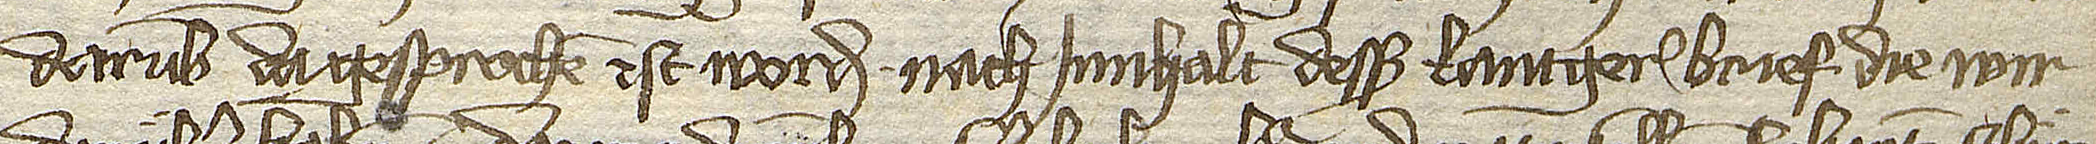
darub* da geſproche* iſt word* . nach Innhalt deſſ* lantger* brief die wir
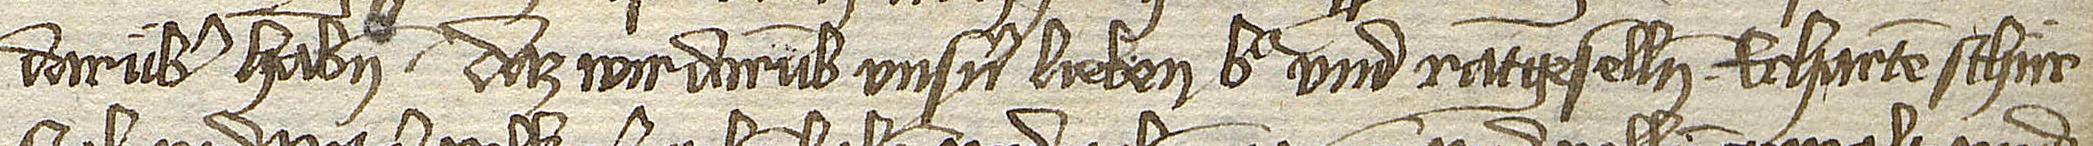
darüb* habn* / Daʒ wir darub* vnſn* lieber b* vnd ratgeſelln* Erharte* ſchür
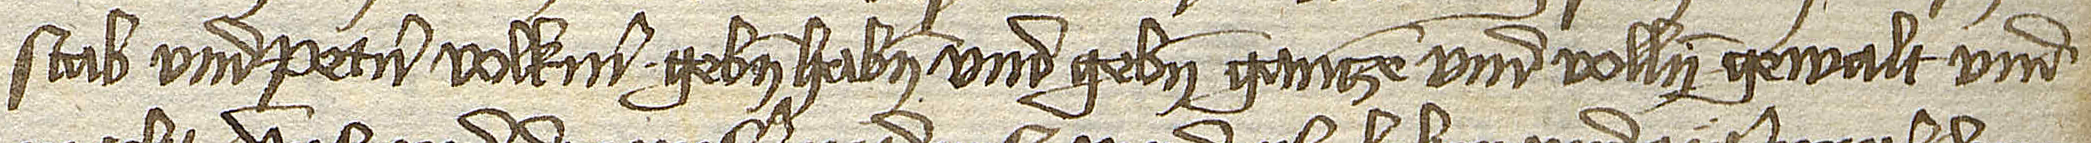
ſtab vnd Petn* volkm* . gebn* habn* vnd gebn* gancʒe* vnd volln* gewalt vnd
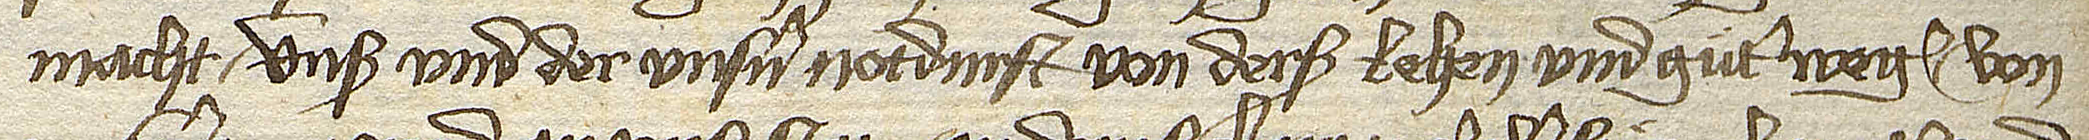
macht / Vnſ* vnd der vnſn* notdurft von derſ* lehen vnd güt* weg* / von
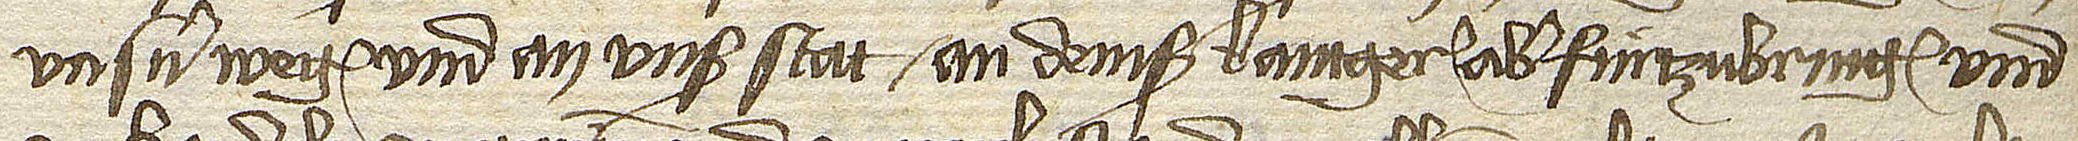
vnſn* weg* vnd an vnſ* ſtat / an demſ* lantger* ab* fürcʒubring* vnd
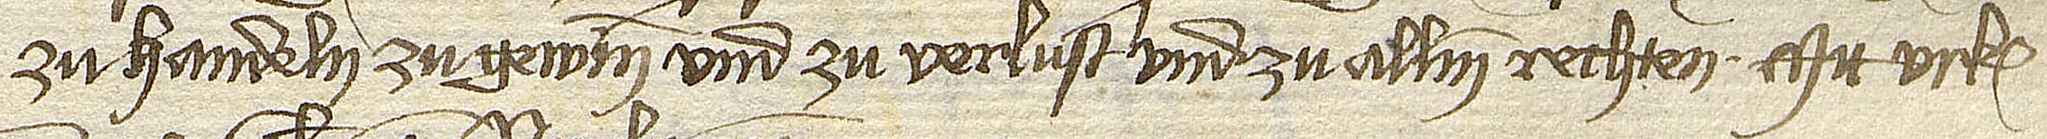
ʒu handeln ʒu gewin* vnd ʒu verluſt vnd ʒu allm* rechten . Mit vrk*
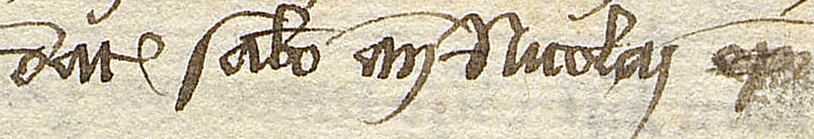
Dat* ſabo* an* Nicolai epi*
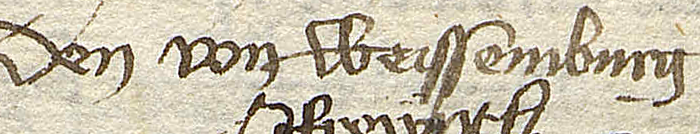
Den von Weiſſemburg
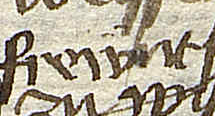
freẅntſ*
